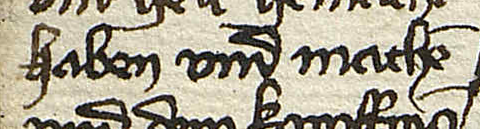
haben vnd mache*
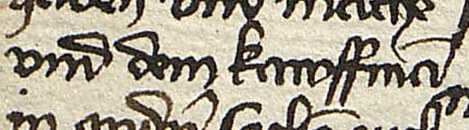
vnd dem kawffma*
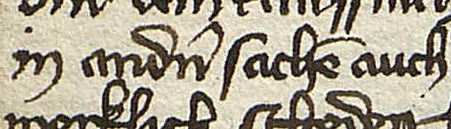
in andn* ſache* auch
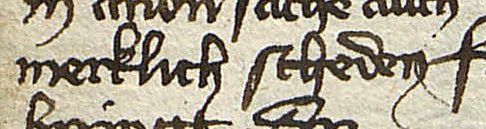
merklich ſcheden
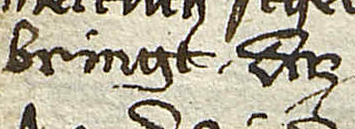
bringt / daʒ
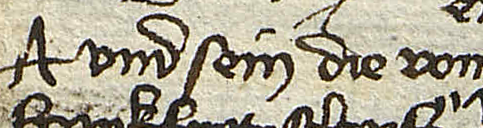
vnd ſein die von
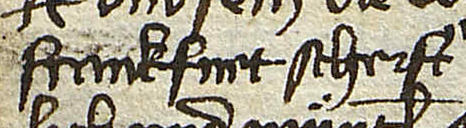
frankfurt ſchrift =
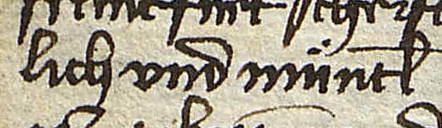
lich vnd müntl*
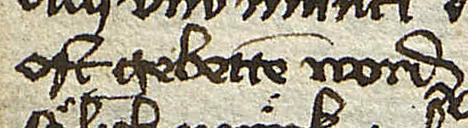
oft gebette* word*
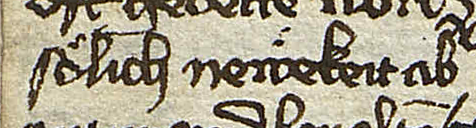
ſölich newekeit ab*
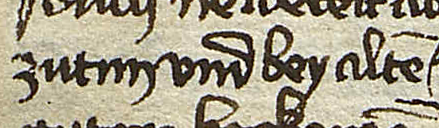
ʒutun vnd bey alte*
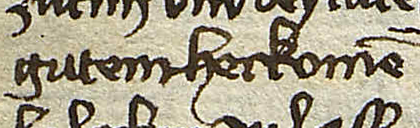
gutem herkome*
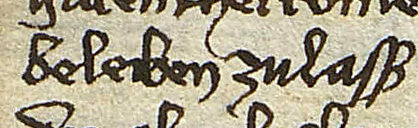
beleiben ʒulaſſ*
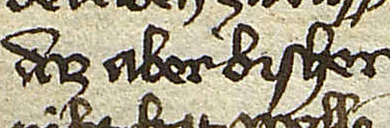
daʒ aber biſher
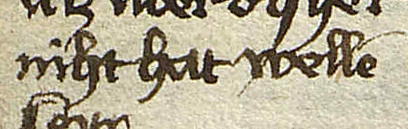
niht hat welle*
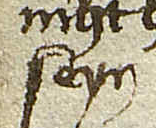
ſeyn
